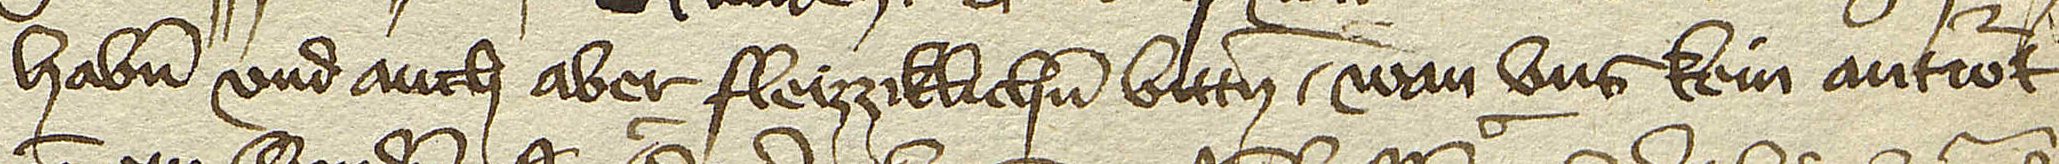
habn* vnd auch aber fleiʒʒiklichn* bittn* / wan vns kein antwt*
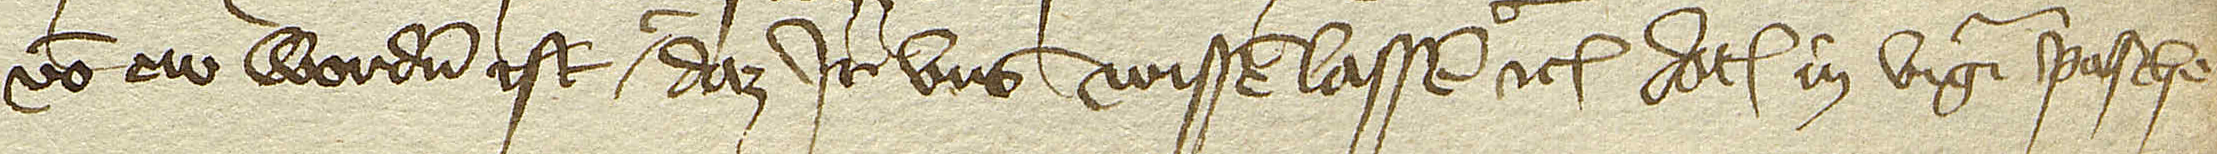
vo* ew wordn* iſt / daʒ Ir vns wiſſe* laſſe* ec* dat* iii* vigi* Paſche
